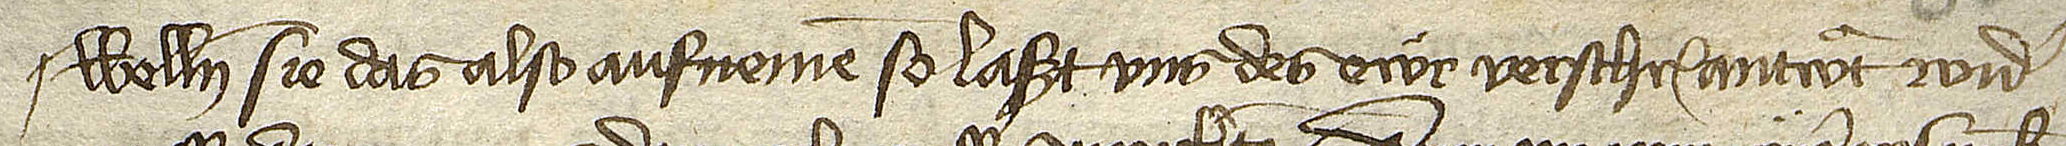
welln* ſie das alſo aufneme* ſo laſʒt vns des eẅr verſchr* antw*t wid*
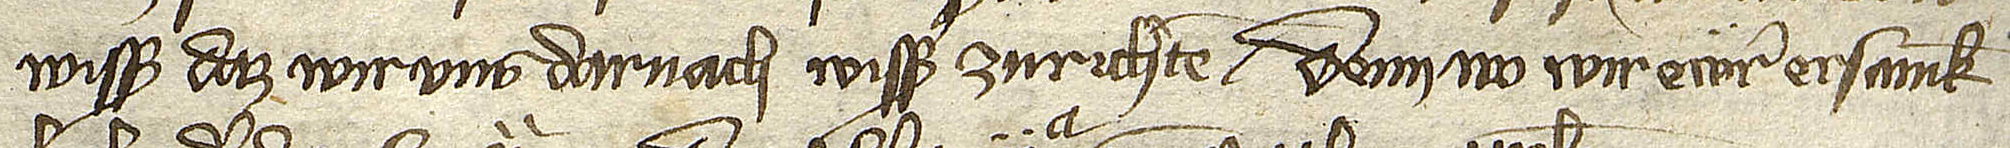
wiſſ* daʒ wir vns darnach wiſſ* ʒurichte* / Denn wo wir eẅr* erſamk*
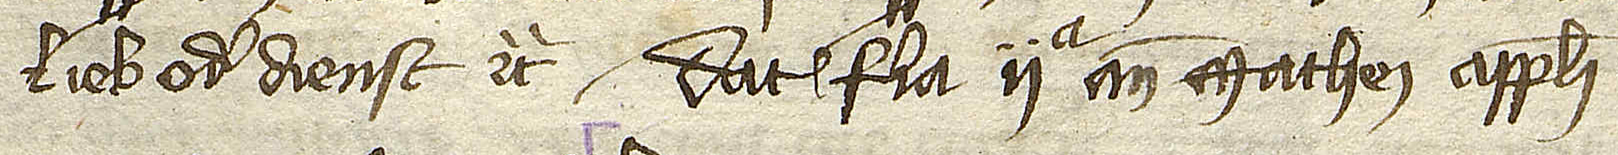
lieb od* dienſt ec* / Dat* fi*a ii* an* Mathei appli*
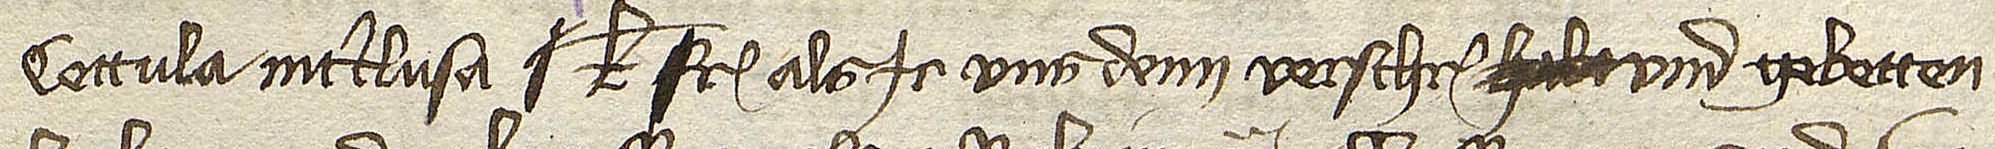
Cettula int*cluſa / L* fr* als Ir vns denn verſchr* habt vnd getten
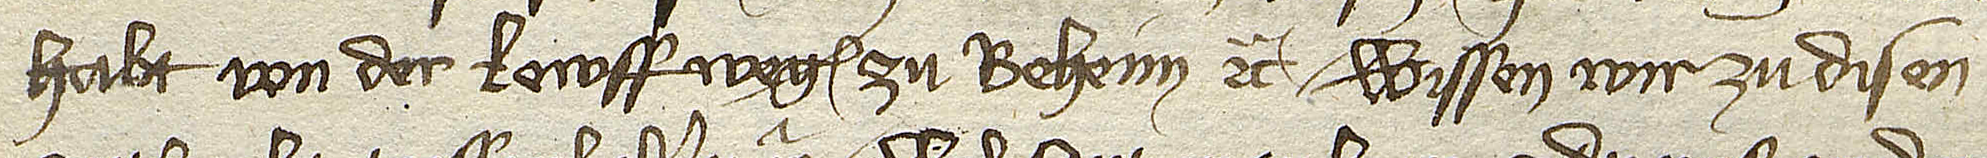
habt von der Lewff weg* cʒu Beheim ec* / Wiſſen wir ʒu diſen
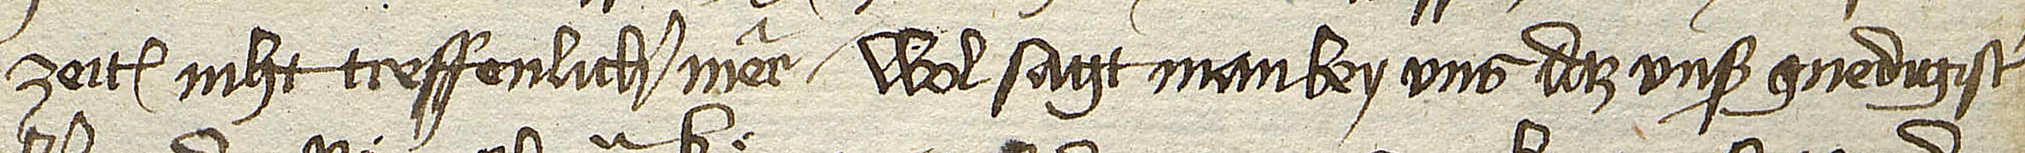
cʒeit* niht treffenlich* mër / Wol ſagt man bey vns / daʒ vnſ* gnedigiſt*
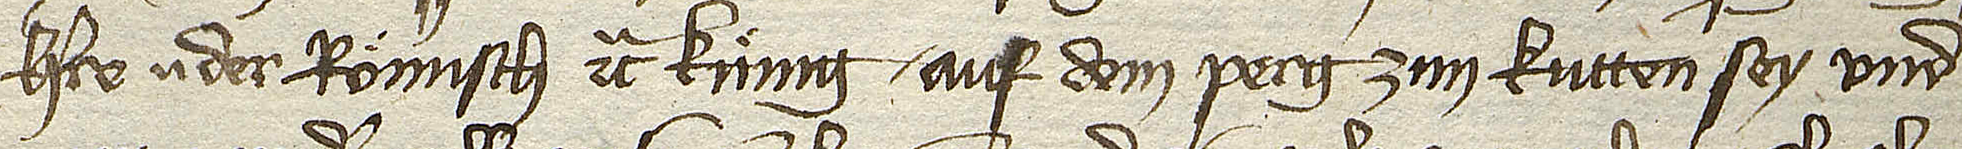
h*re ~ der Römiſch ec* künig / auf dem perg ʒun kutten ſey vnd
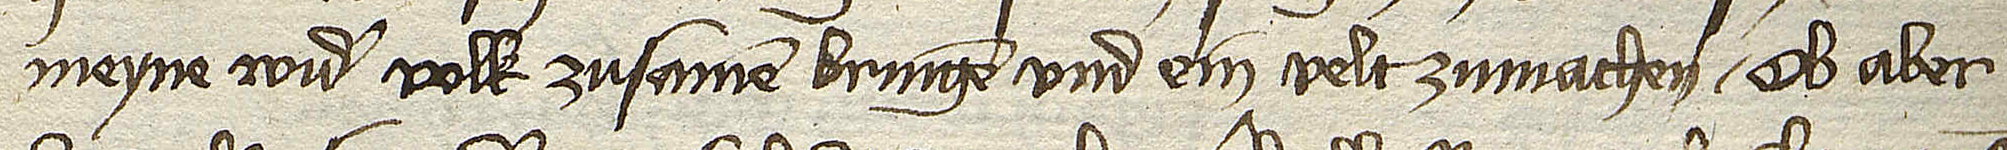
meyne wid* volk ʒuſame* bringe* vnd ein velt ʒumachen / Ob aber
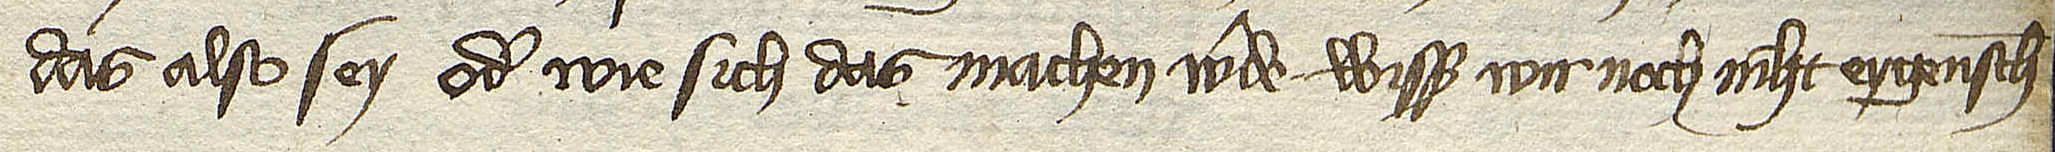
das alſo ſey od* wie ſich das machen w*de / wiſſ* wir noch niht eygenſch*
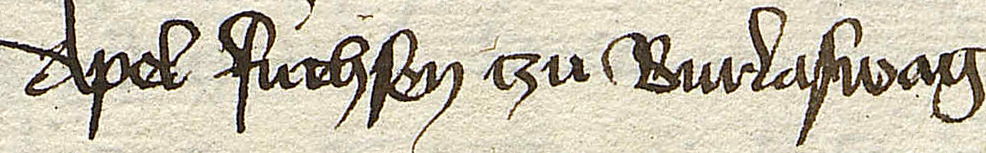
Apel Füchſen cʒu Burlaſwag*
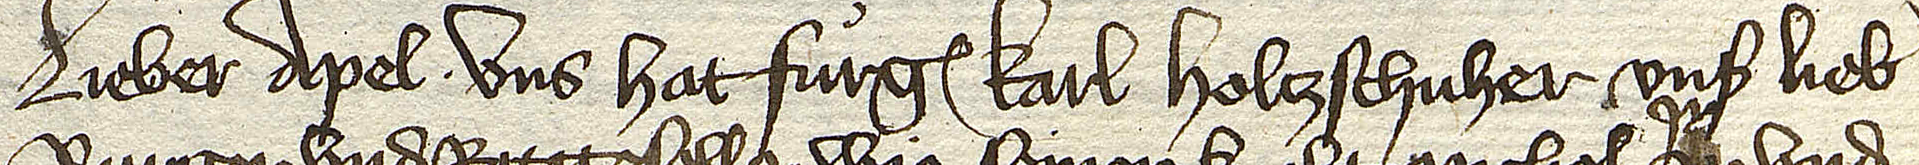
Lieber Apel . Vns hat fürg* Karl Holcʒſchuher vnſ* lieb*
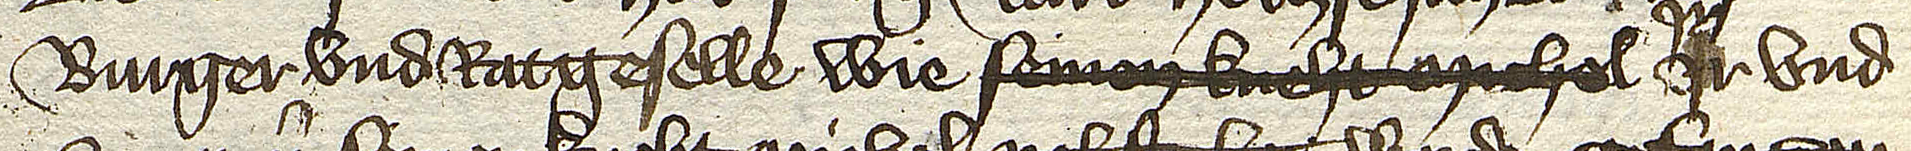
Burger vnd Rateſelle wie ſeinen kneht Michel Ir vnd
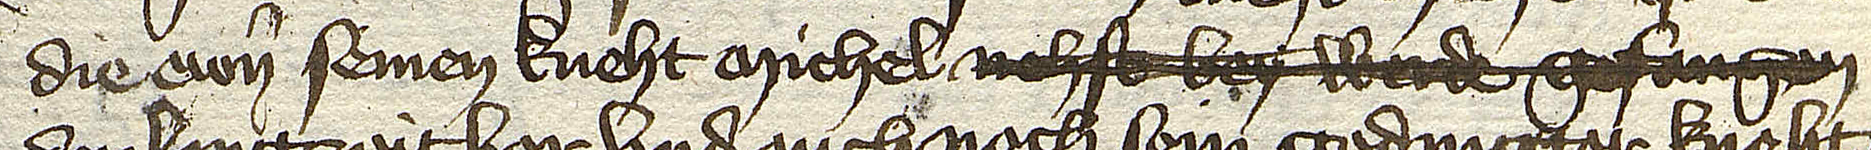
die ew*n ſeinen kneht Michel nehſt bey werde gefangen
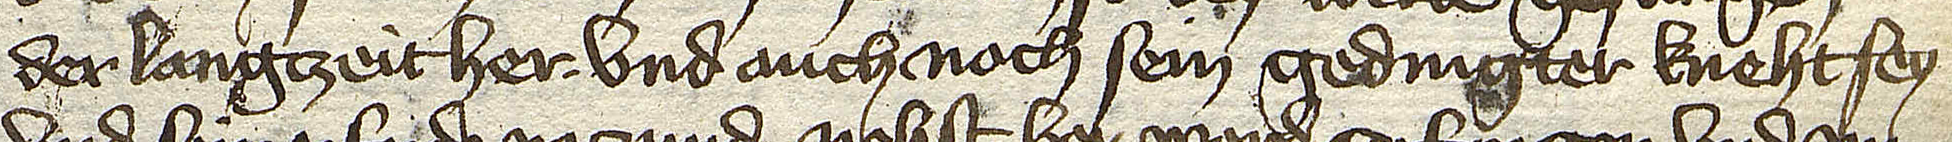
der langcʒeit her . vnd auch noch ſein gedingter kneht ſey
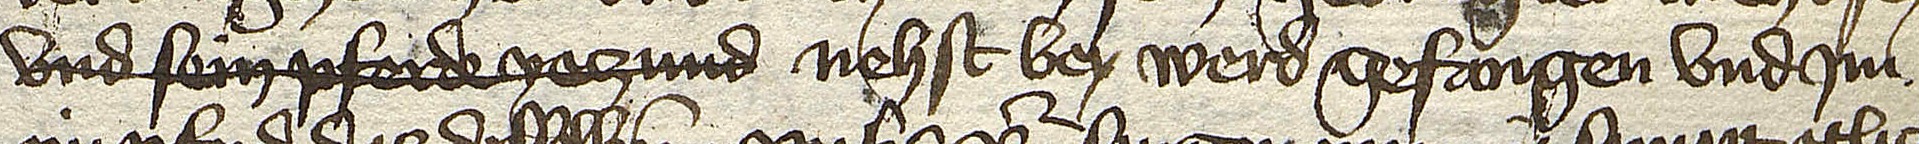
vnd ſein pferde yecʒund nehſt bey werd gefangen vnd Im
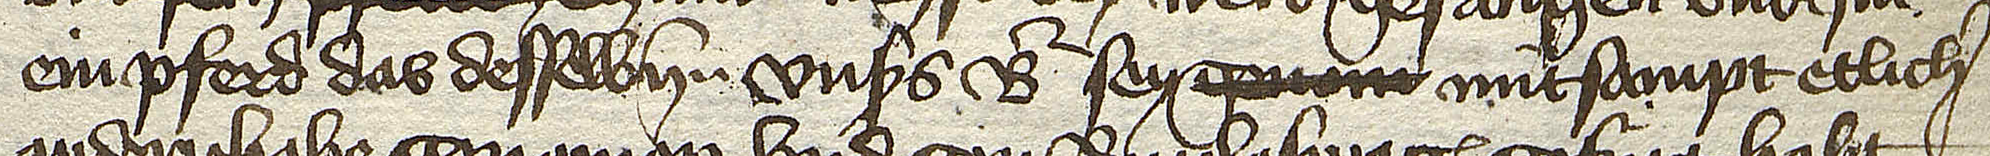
ein pferd das deſſelbn* ~ vnſ*s B* ſey genom mitſampt etlich*
